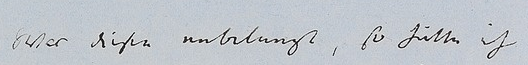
Was diesen anbelangt, so hätte ich
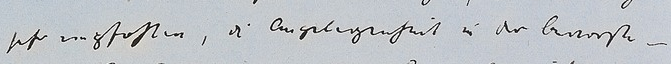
sehr empfohlen, die Angelegenheit in der bevorste-
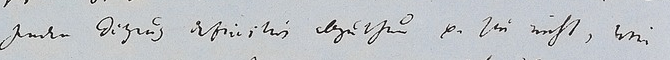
henden Sitzung definitiv abzuthun &. sie nicht, wie
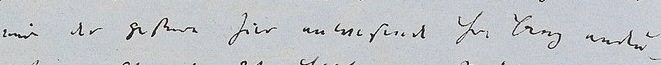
mir der gestern hier anwesende Hr. Benz andeu-
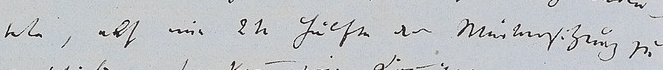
tete, auf eine 2te Hälfte der Wintersitzung zu
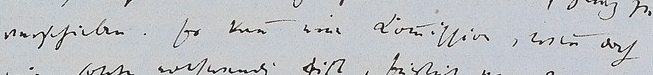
verschieben. Es kann eine Kommission, wenn doch
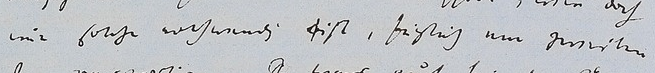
eine solche nothwendig ist, füglich am zweiten
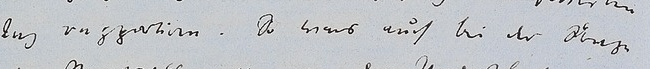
Tag rapportiren. So wars auch bei der Frage
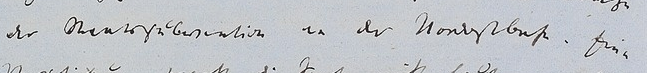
der Staatssubvention an der Nordostbahn. Eine
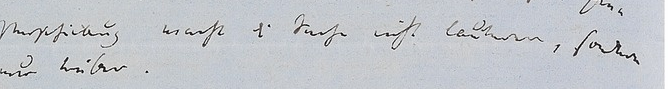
Verschiebung macht die Sache nicht lauterer, sondern
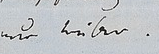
nur trüber.
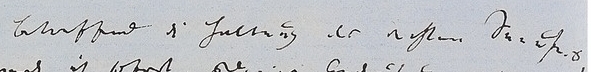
Betreffend die Haltung des rechten Seeufers,
